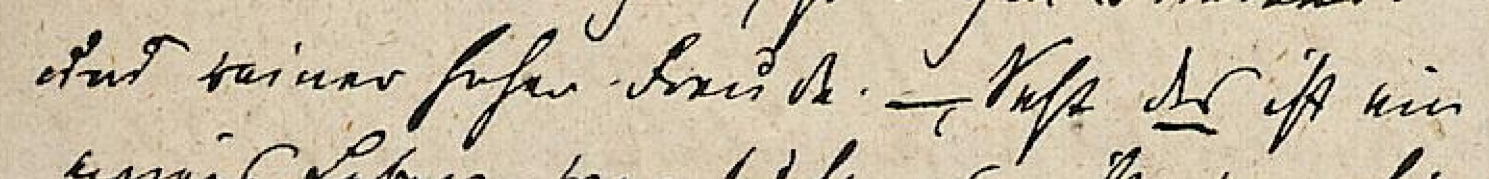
und reiner hoher Freude _ Seht ds ist ein
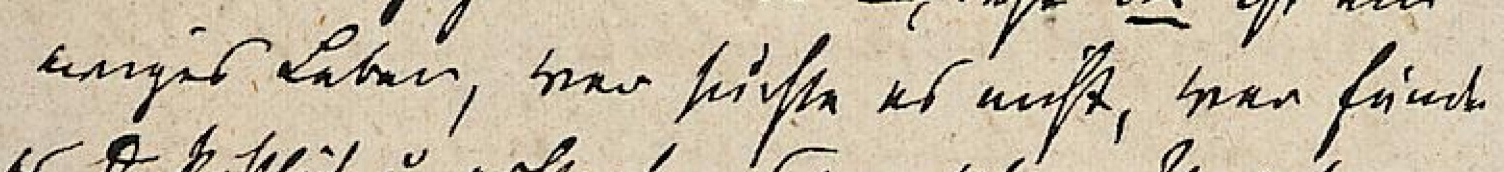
ewiges Leben, wer suchte es nicht, wer fände
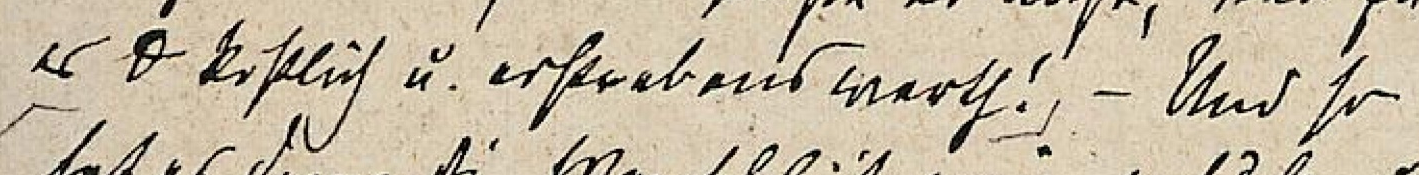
es o köstlich u. erstrebenswerth! - Und so
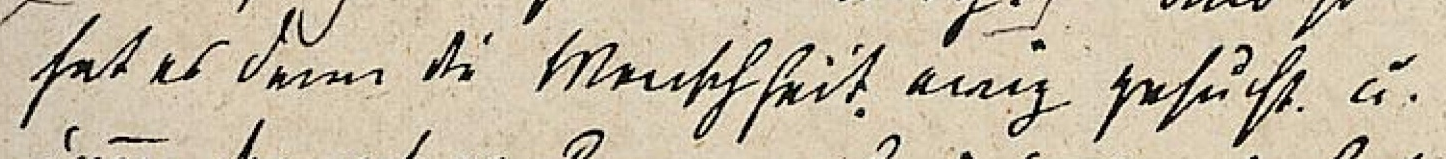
hat es dann die Menschheit weig gesucht u.
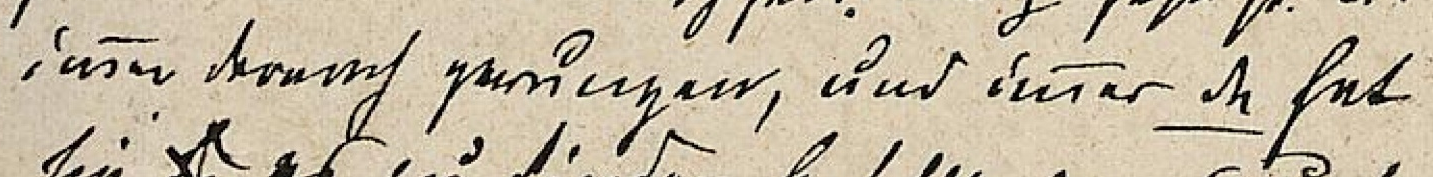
imer dernach gerungen, und imer da hat
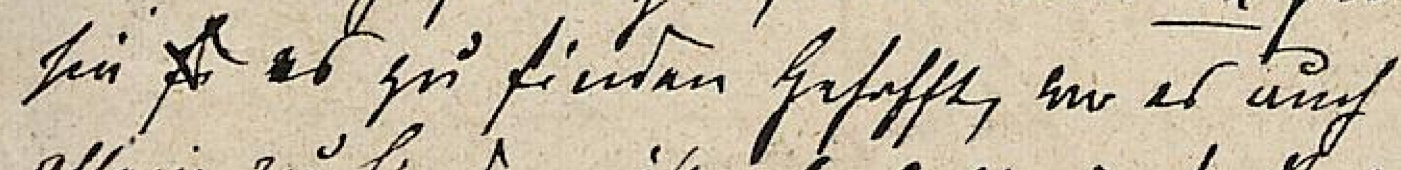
sie fr es zu finden Gehofft, wo es auch
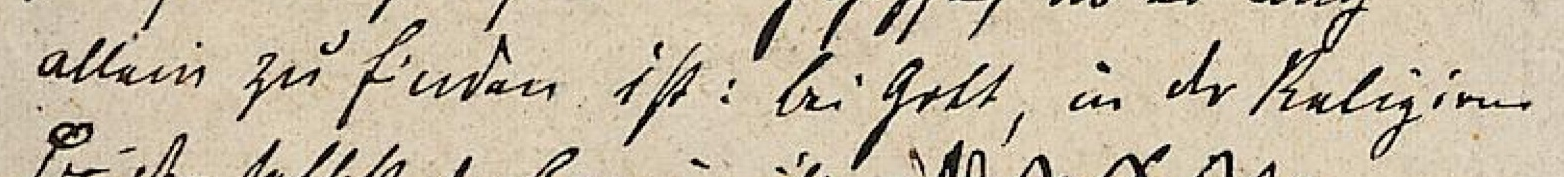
allein zu finden ist: bei Gott, in dr Religien
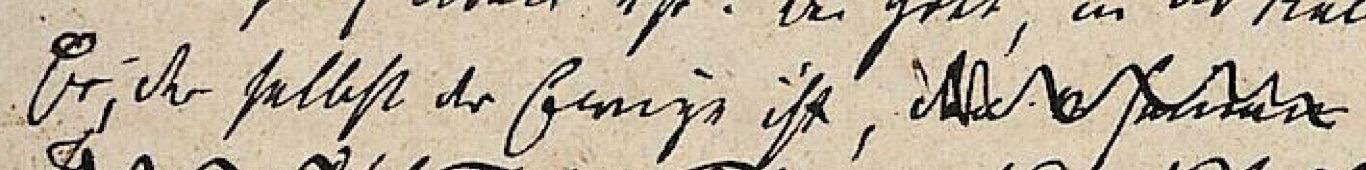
Er, dr selbst dr Ewige ist, der v. seinem
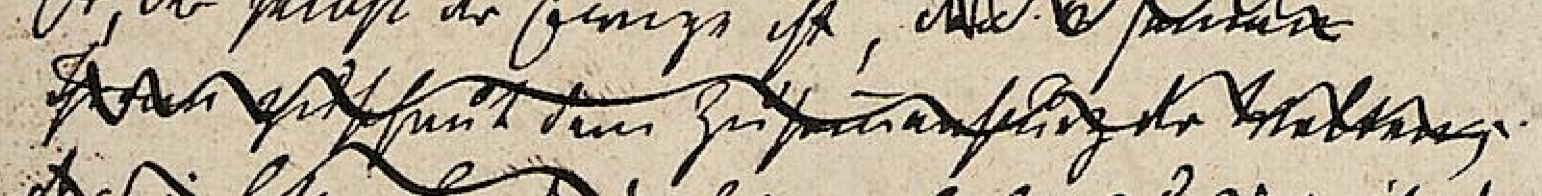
Throne zuschaut dem Zusamensturz der Welten,
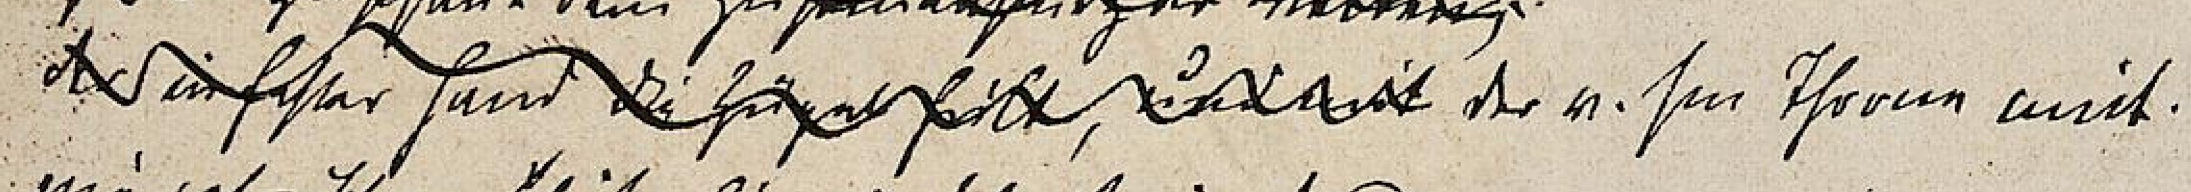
der in fester Hand die Zügel hält, und mit der v. sm Thranm mit
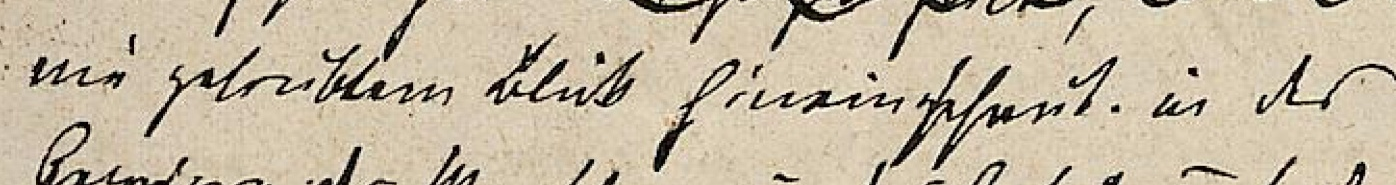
nie getrübtem Blick hineinschaut. in das
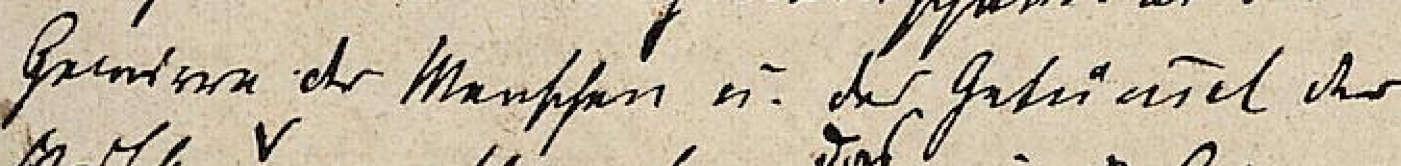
Gewirre der Menschen u. das Getümel der
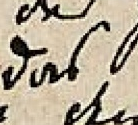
das
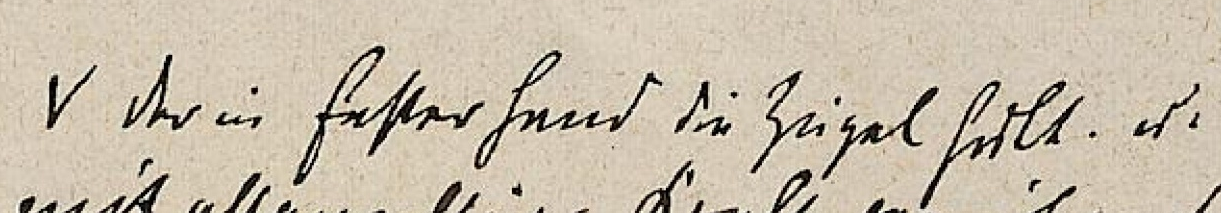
V der in fester Hand die Zeigel hält u.
